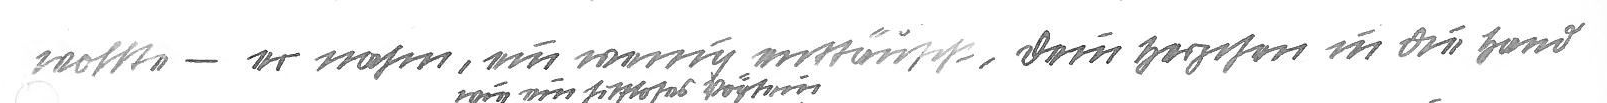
wollte – er nahm, ein wenig enttäuscht, Dein Herzchen in die Hand
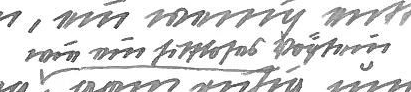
wie ein hilfloses Vöglein
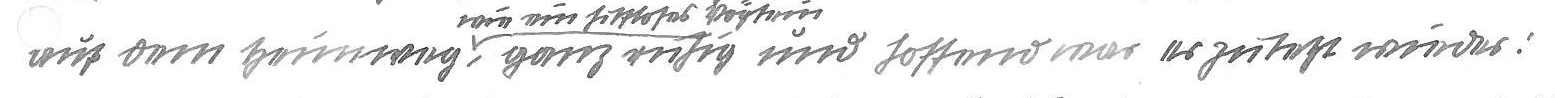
auf dem Heimweg, ganz ruhig und hoffend war er zuletzt wieder:
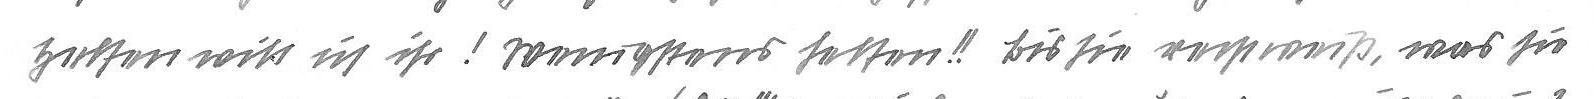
Helfen will ich ihr! Wenigstens helfen!! Bis sie recht weiß, was sie
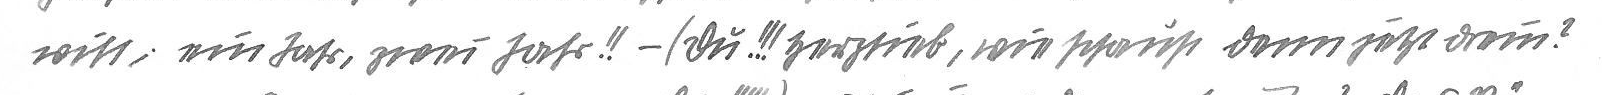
will; ein Jahr, zwei Jahr!! – ( Du!!! Herzlieb, wie schaust denn jetzt drein?
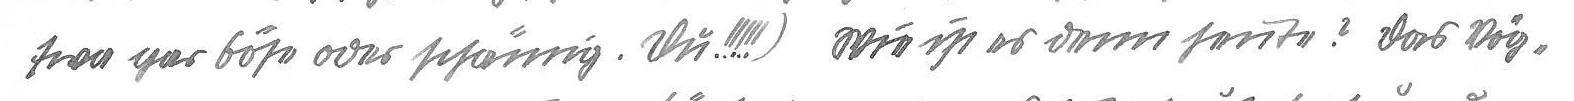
Ewa gar böse oder schämig. Du!!!!!) Wie ist es denn heute? Das Vög¬
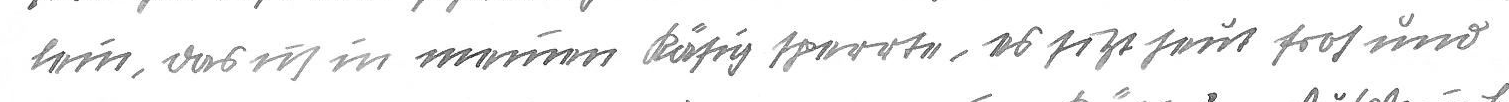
lein, das ich in meinen Käfig sperrte, es sitzt heut froh und
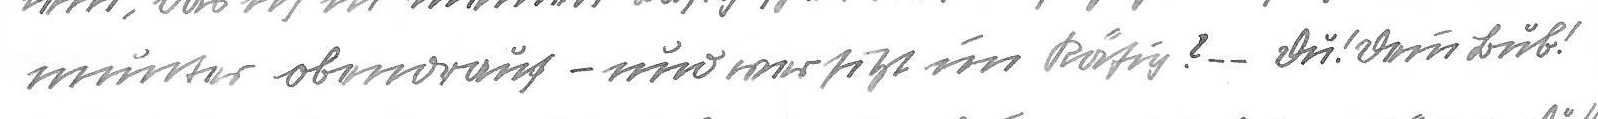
munter obendrauf – und wer sitzt im Käfig?— Du! Dein Bub!
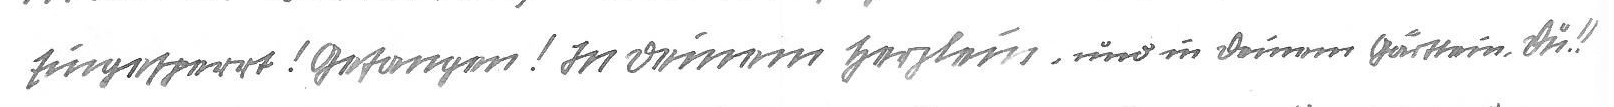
Eingesperrt! Gefangen! In Deinem Herzlein, und in Deinem Gärtlein, Du!!
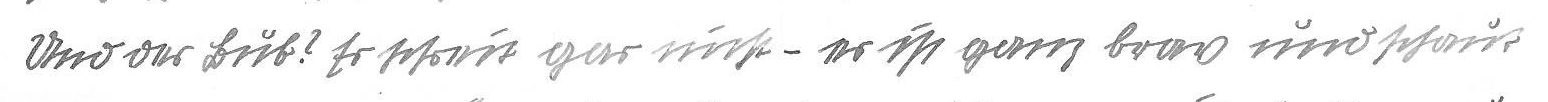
Und der Bub? Er schreit gar nicht – er ist ganz brav und schaut
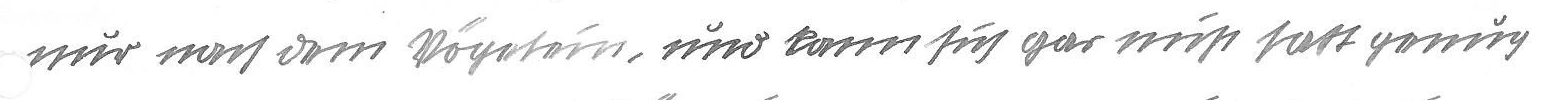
nur nach dem Vöglein, und kann sich gar nicht satt genug
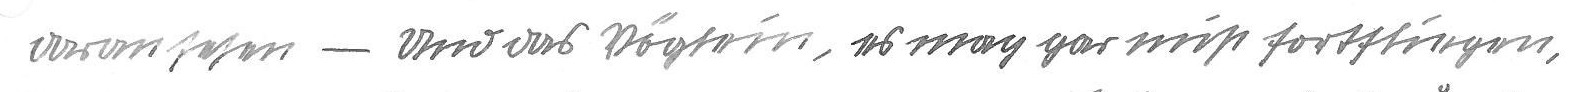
daran sehen – Und das Vöglein, es mag gar nicht fortfliegen,
